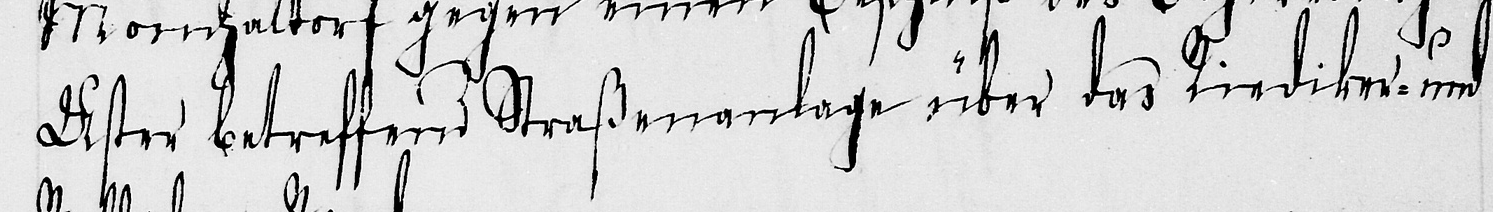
Uster betreffend Straßenanlage über das Riediker- und
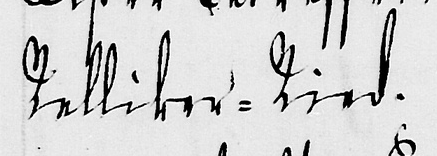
Relliker-Ried.
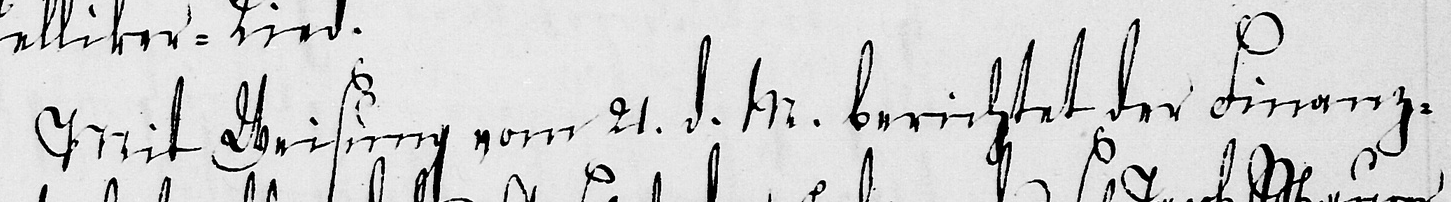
Mit Weisung vom 21. d. M. berichtet der Finanz¬
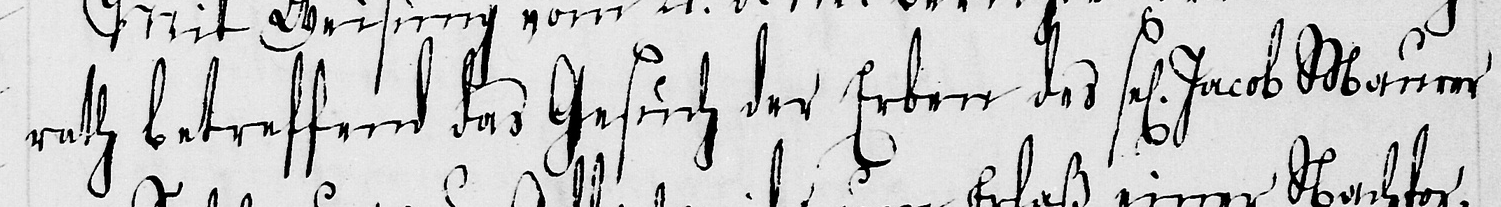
rath betreffend das Gesuch der Erben des sel. Jacob Maurer
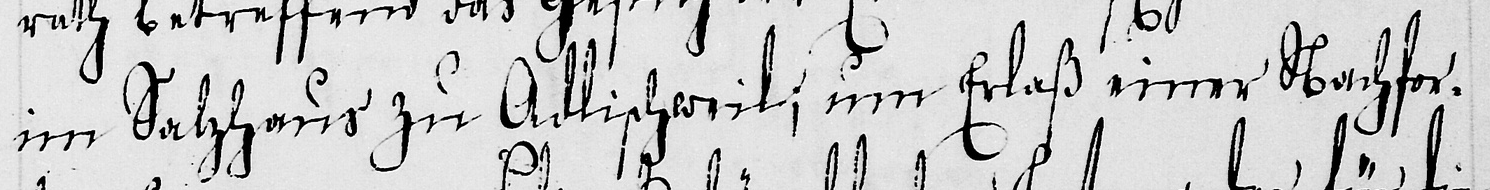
im Salzhaus zu Adlischweil; um Erlaß einer Nachfor¬
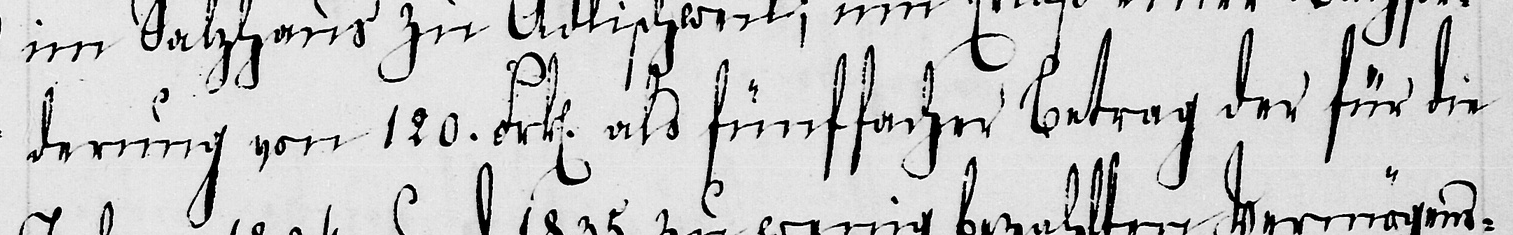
derung von 120 Frk[en]. als fünfacher Betrag der für die
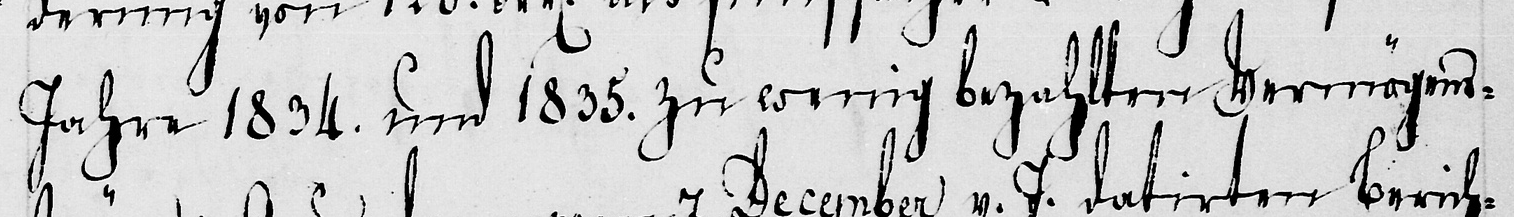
Jahre 1834. und 1835. zu wenig bezahlten Vermögens¬
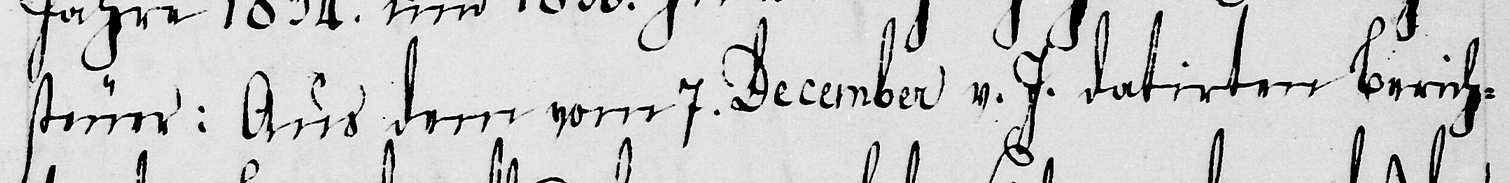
steuer: Aus dem vom 7. December v. J. datirten Berich¬
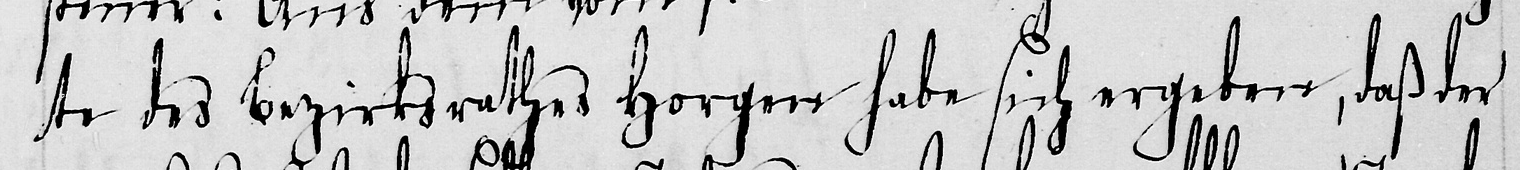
te des Bezirksrathes Horgen habe sich ergeben, daß der
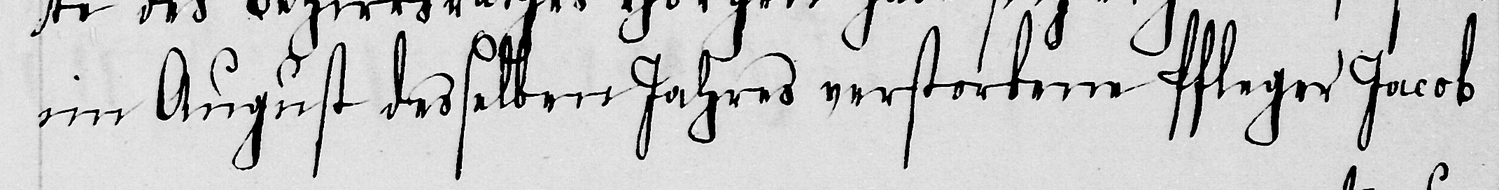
im August desselben Jahres verstorbene Pfleger Jacob
